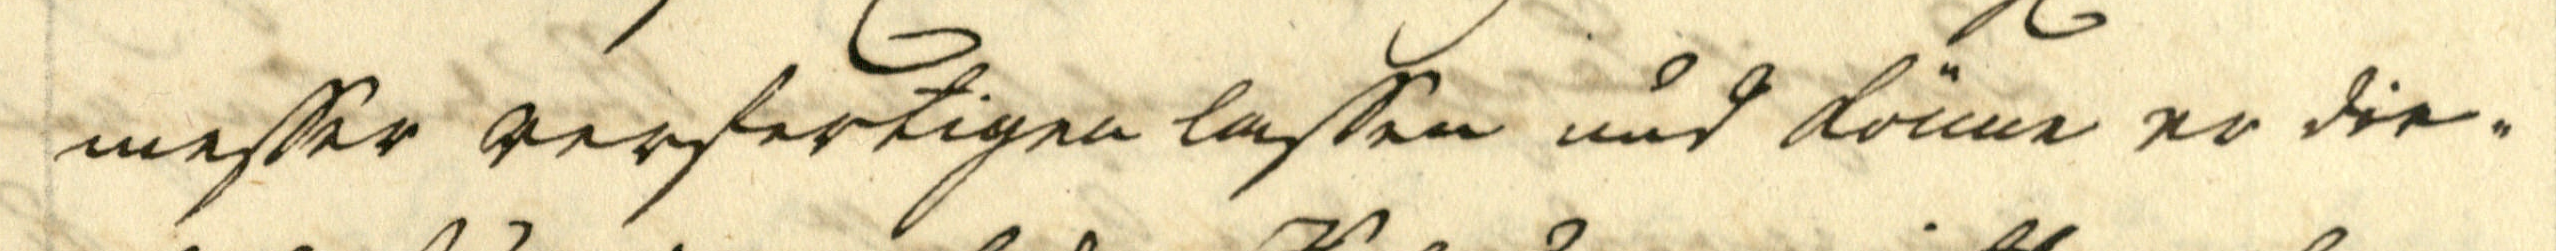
messer verfertigen lassen und könne er die¬
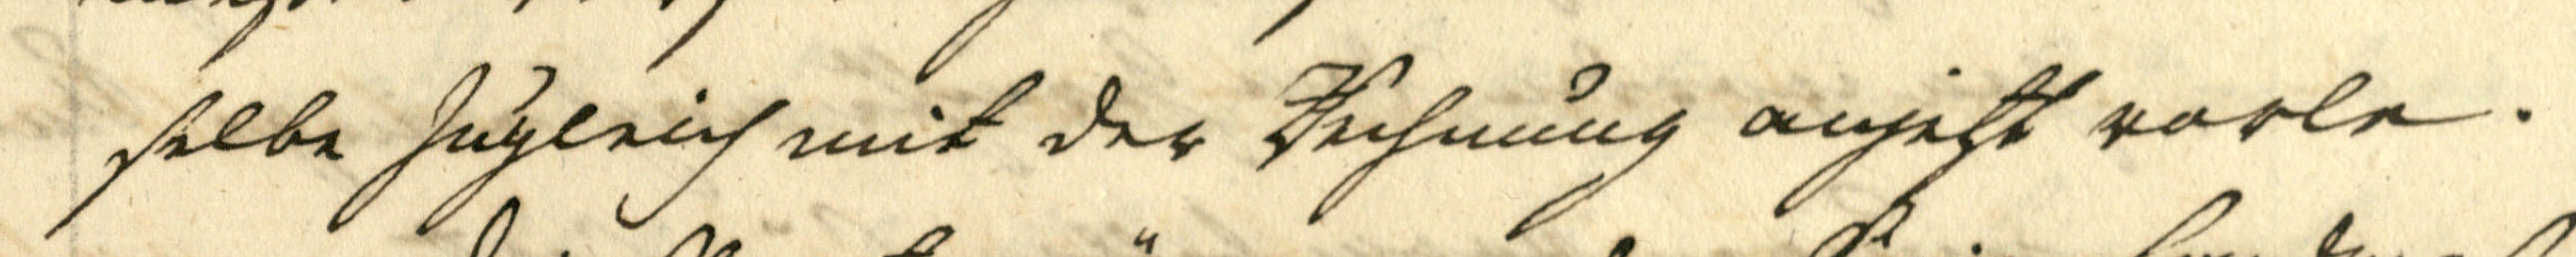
selbe zugleich mit der Rechnung anjetzt vorle-
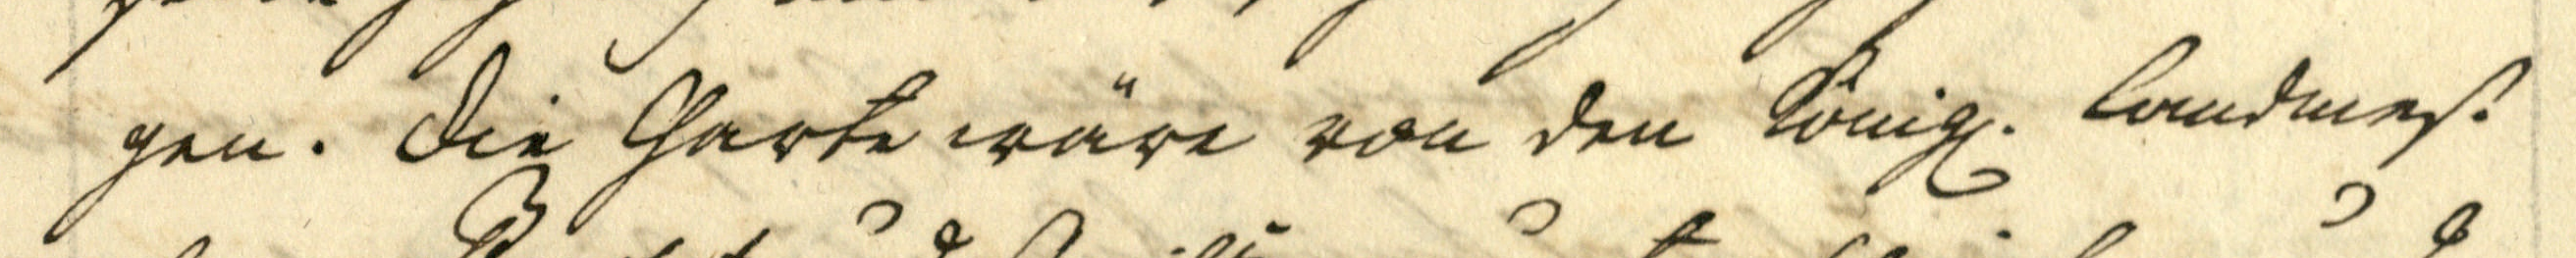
gen. Die Charte wäre von den Königl. Landmes¬
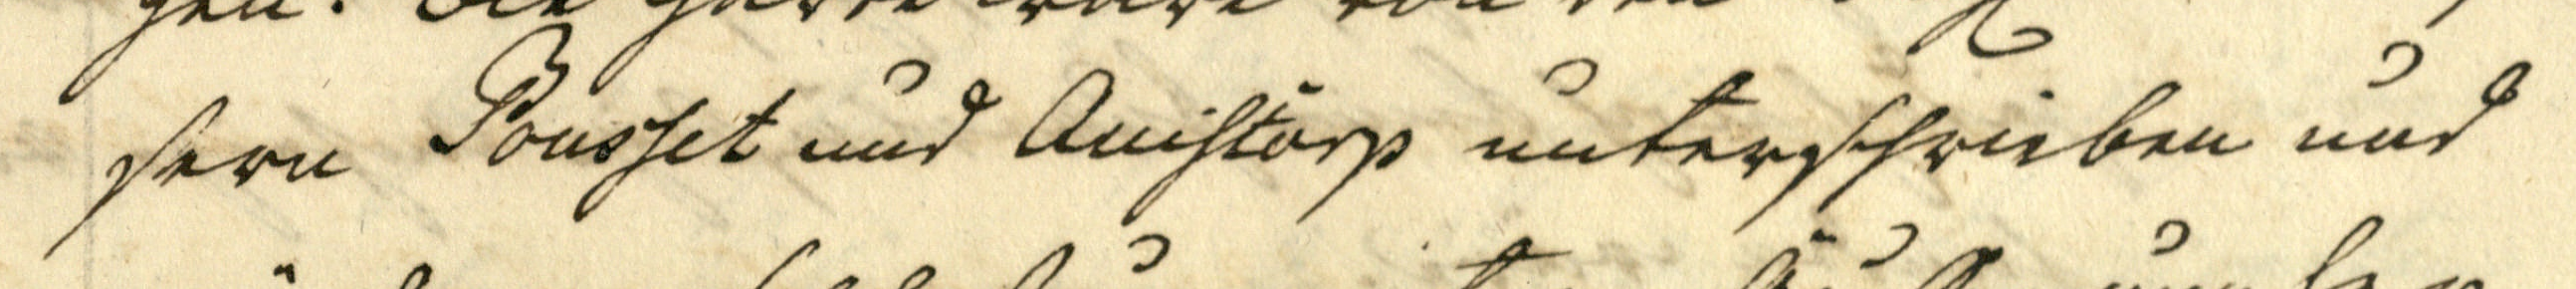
sern Pousset und Quistorp unterschrieben und
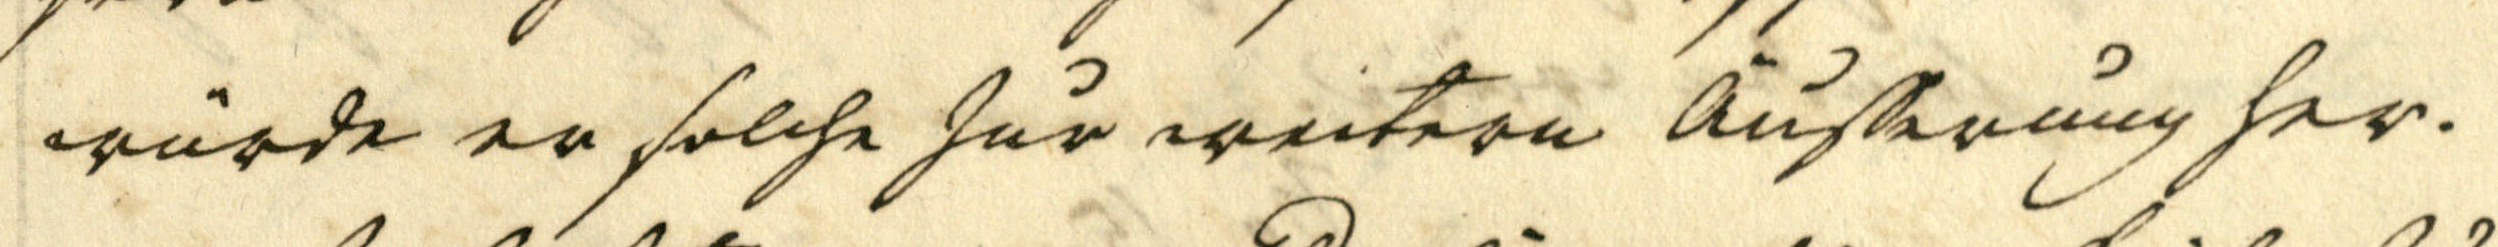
würde er solche zur weitern Äusserung Her¬
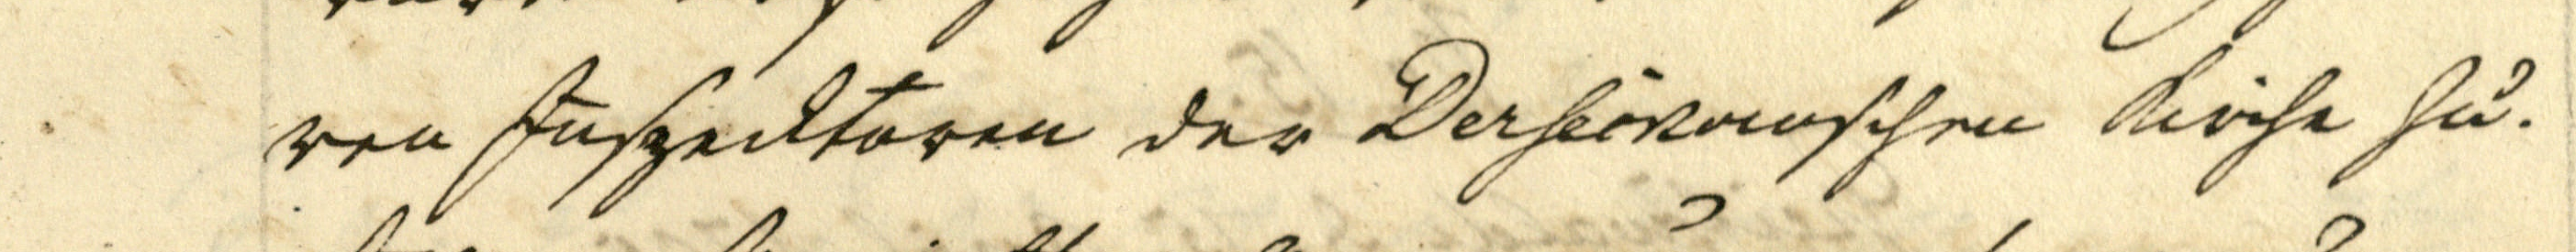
ren Inspectoren der Deseckowschen Kirche zu¬
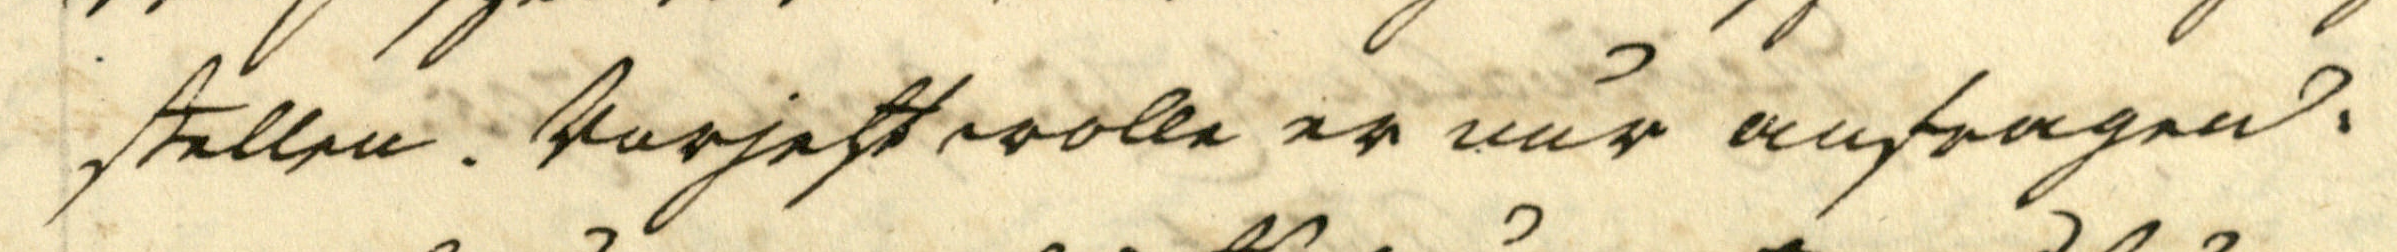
stellen. Vorjetzt wolle er nur anfragen:
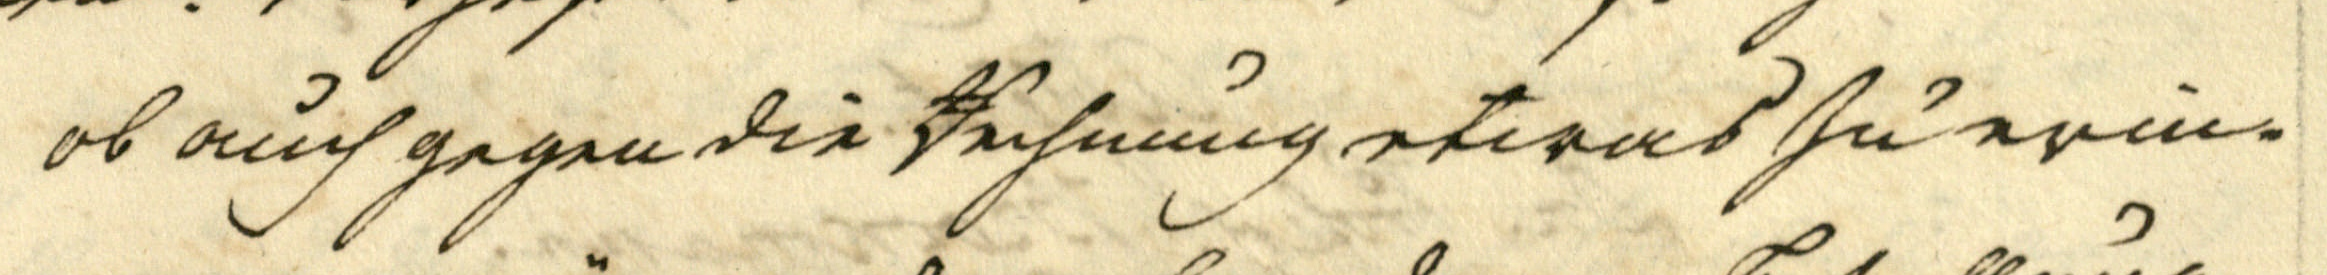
ob auch gegen die Rechnung etwas zu erin¬
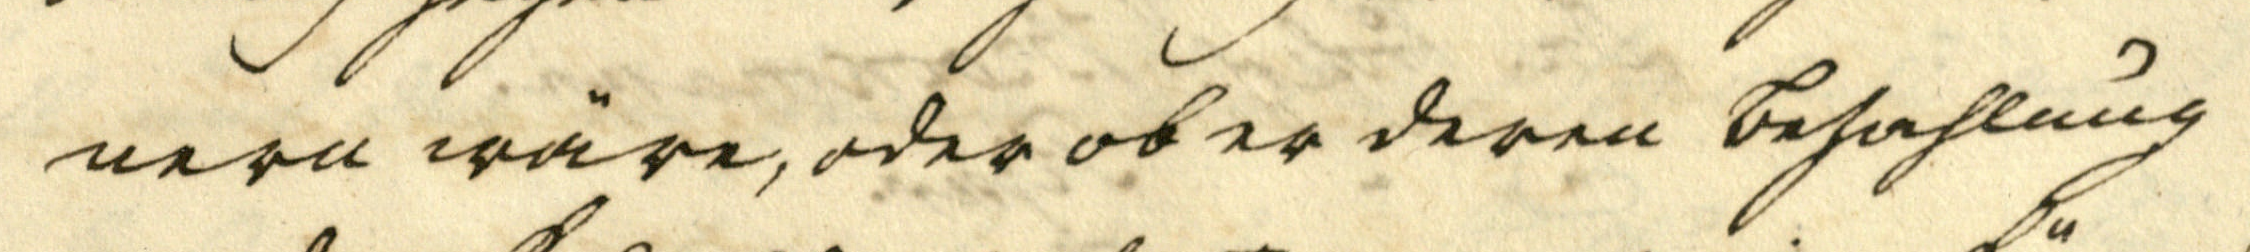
nern wäre, oder ob er deren Bezahlung
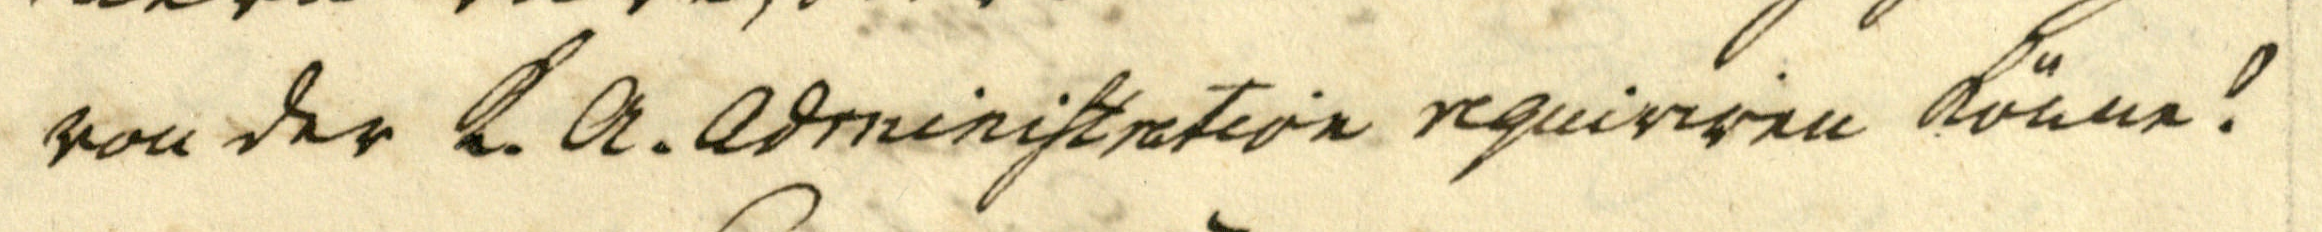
von der K. A. Administration requiriren könne?
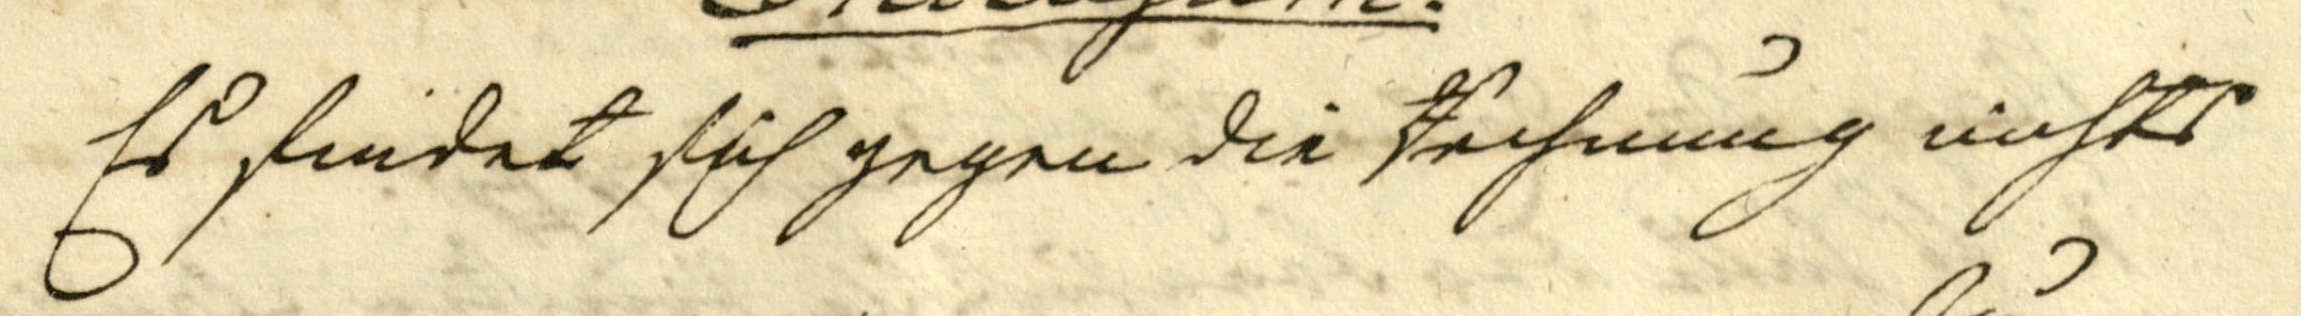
Es findet sich gegen die Rechnung nichts
